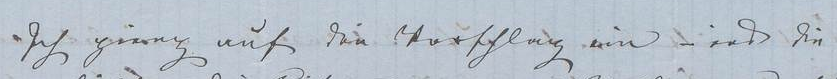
Ich gieng auf den Vorschlag ein – und die
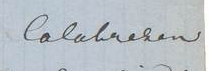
Calabresen
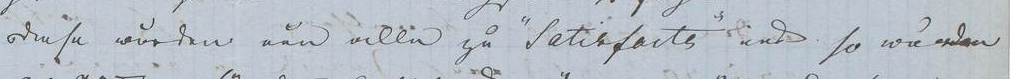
Diese wurden nun alle zu «Satisfacts» und so wurden
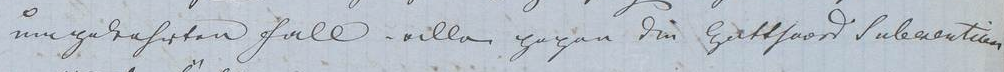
umgekehrten Fall – alle gegen die Gotthard Subvention
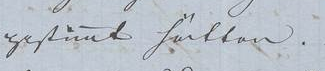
gestimmt hätten. –
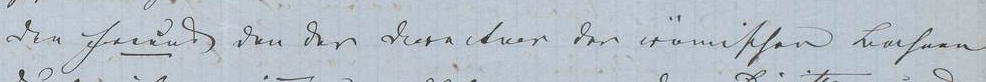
Den Freund den der Director der römischen Bahnen
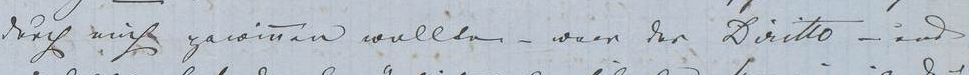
durch mich gewinnen wollte – war der Diritto – und
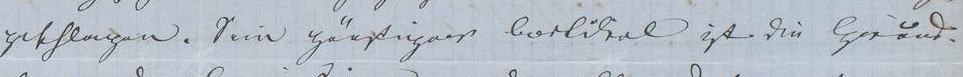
geschlagen. Sein günstiger Artikel ist die Grund-
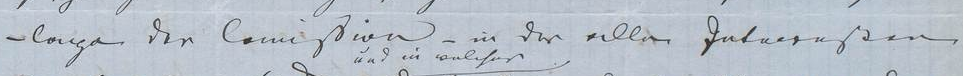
lage der Comission – in der alle Intereßen
